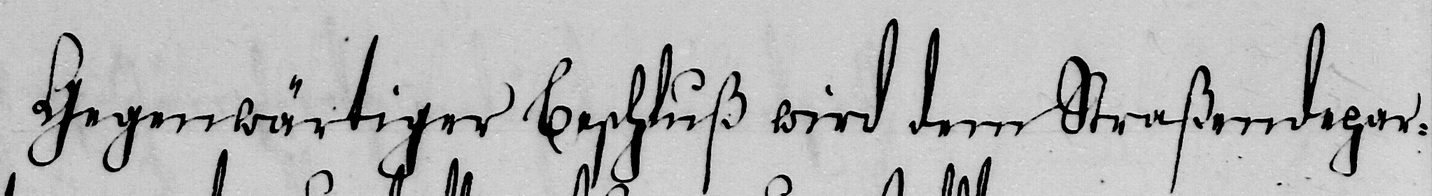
Gegenwärtiger Beschluß wird dem Straßendepar¬
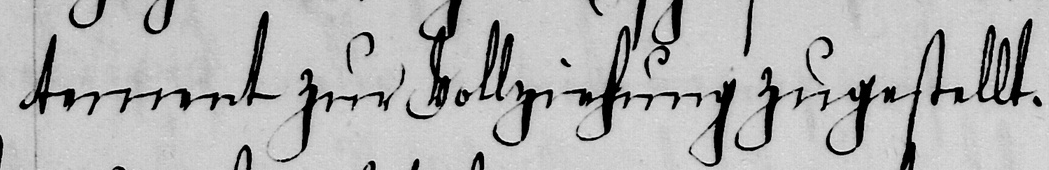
tement zur Vollziehung zugestellt.
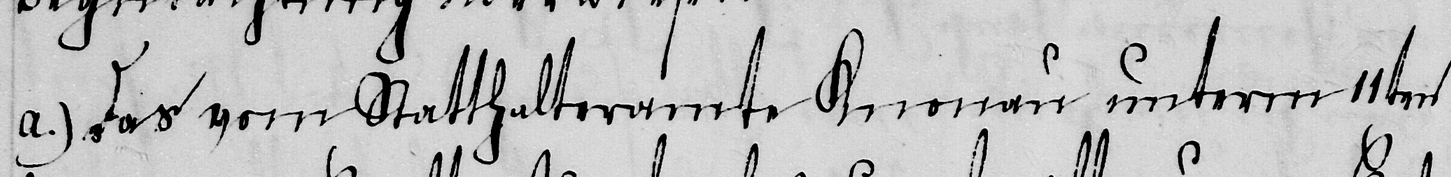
a.) Das vom Statthalteramte Knonau unterm 11ten
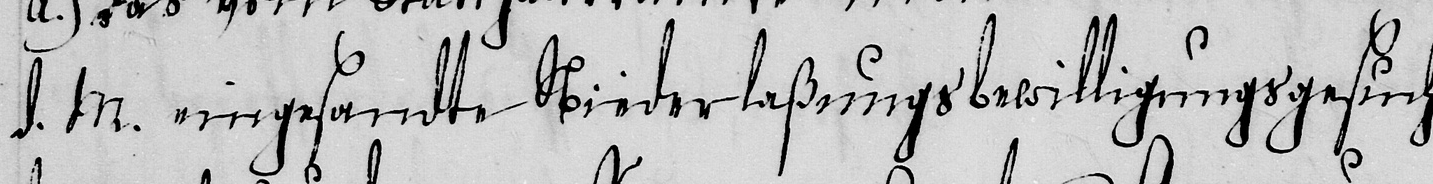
d. M. eingesandte Niederlaßungsbewilligungsgesuch
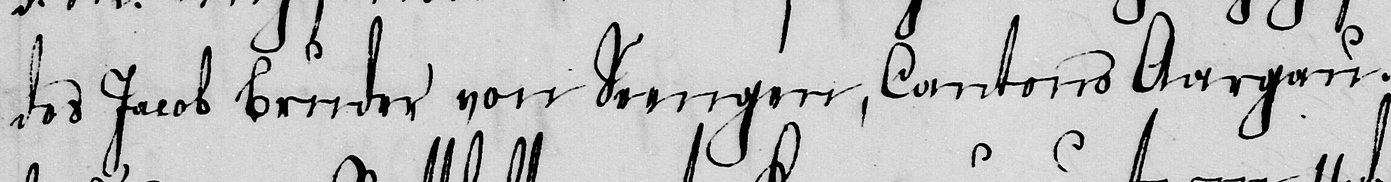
des Jacob Bruder von Seengen, Cantons Aargau.
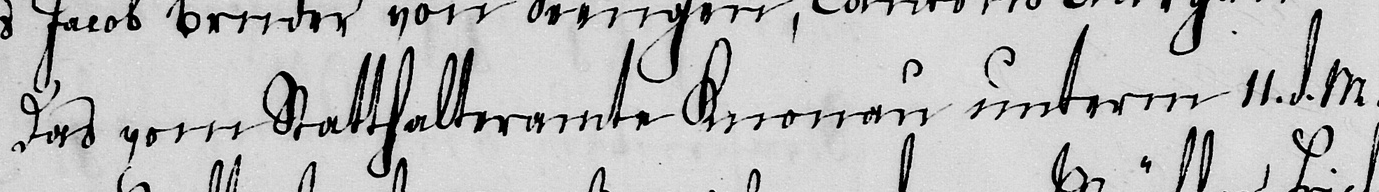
Das vom Statthalteramte Knonau unterm 11. d. M.
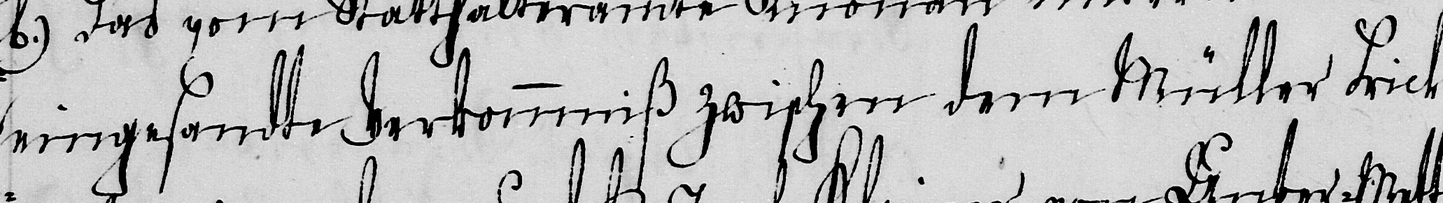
eingesandte Verkommniß zwischen dem Müller Frick
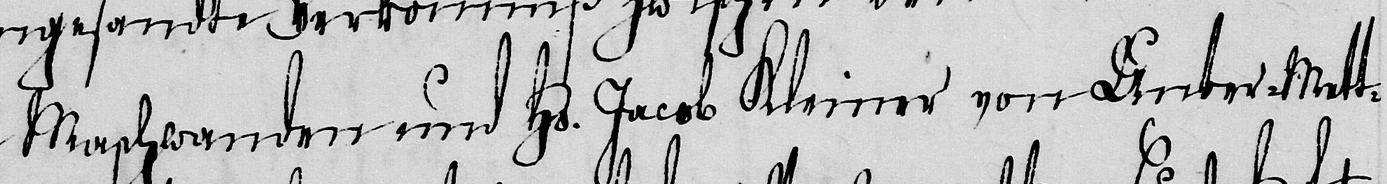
Maschwanden und Hs. Jacob Kleiner von Unter-Mett¬
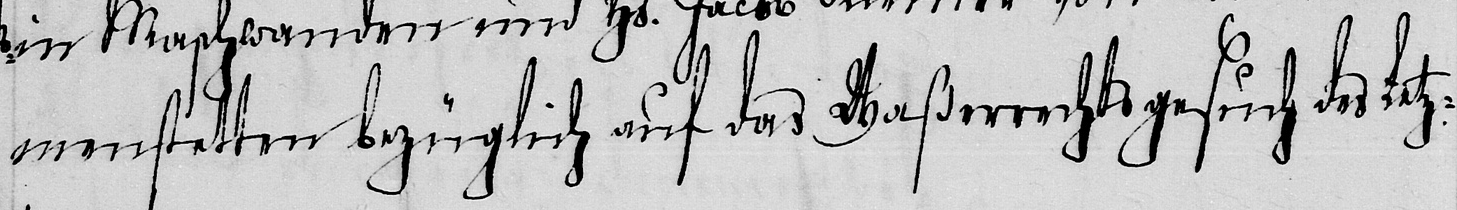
menstetten bezüglich auf das Waßerrechts¬
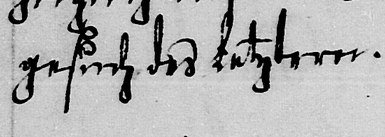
gesuch des Letztern.
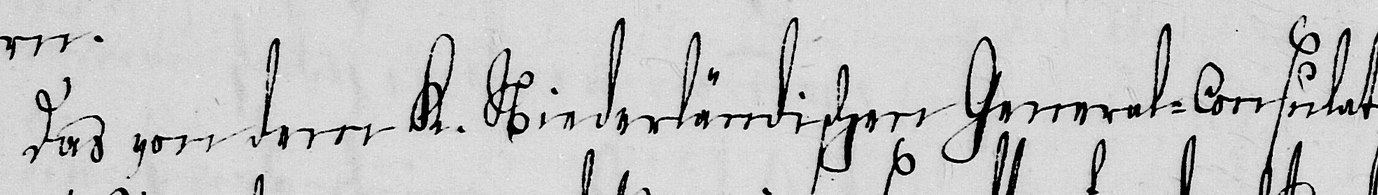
Das von dem K. Niederländischen General-Consulat
